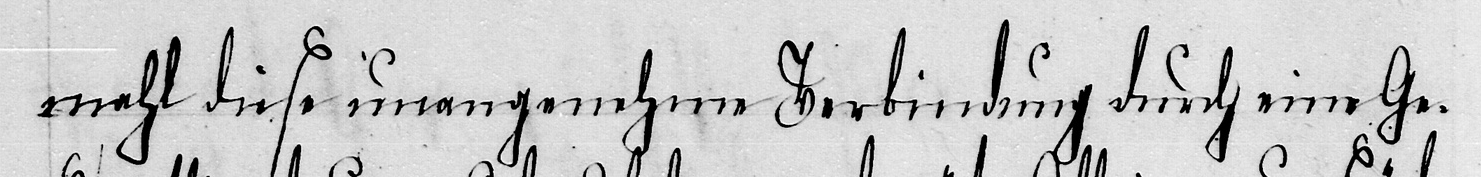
mahl diese unangenehme Verbindung durch eine Ges¬
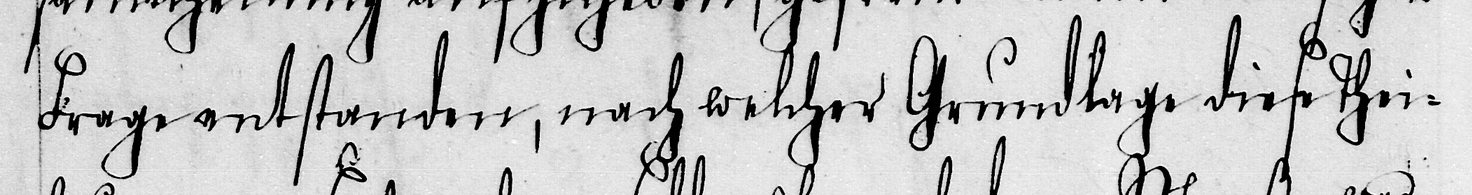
Frage entstanden, nach welcher Grundlage diese Thei¬
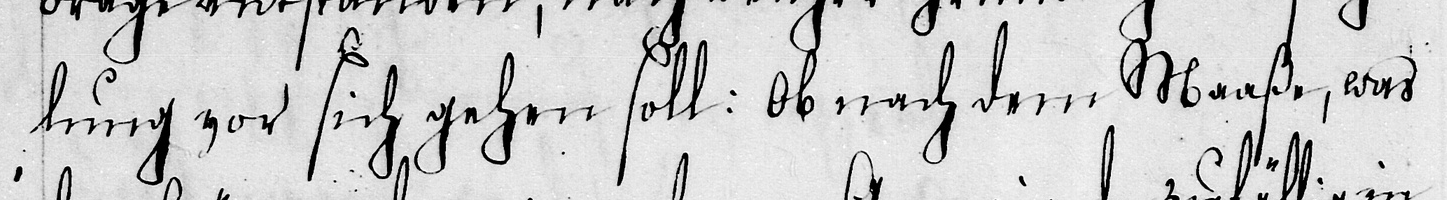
lung vor sich gehen soll: Ob nach dem Maaße, was
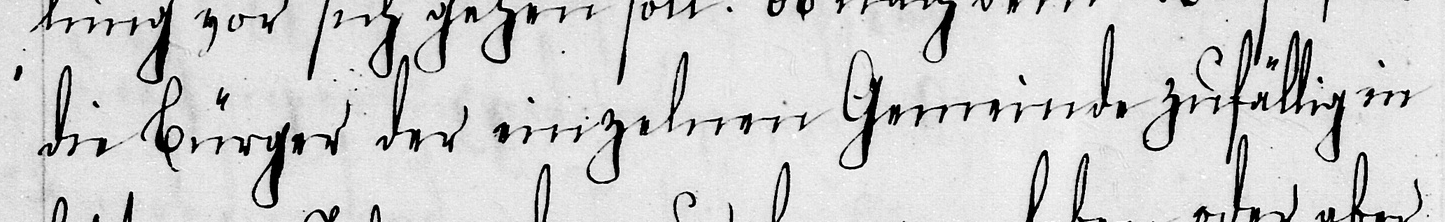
die Bürger der einzelnen Gemeinde zufällig in
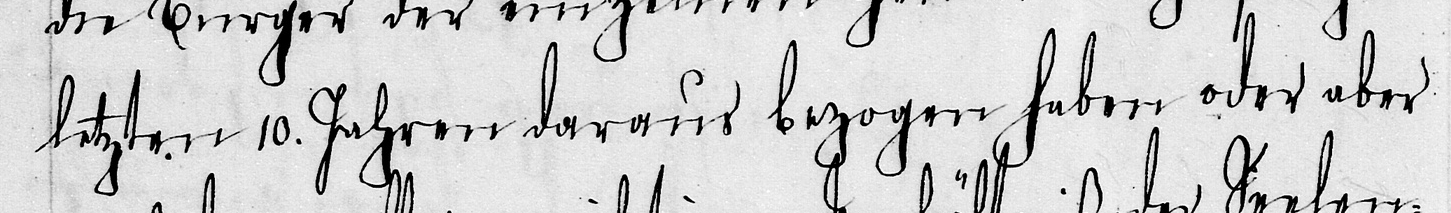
letzten 10. Jahren daraus bezogen haben oder aber
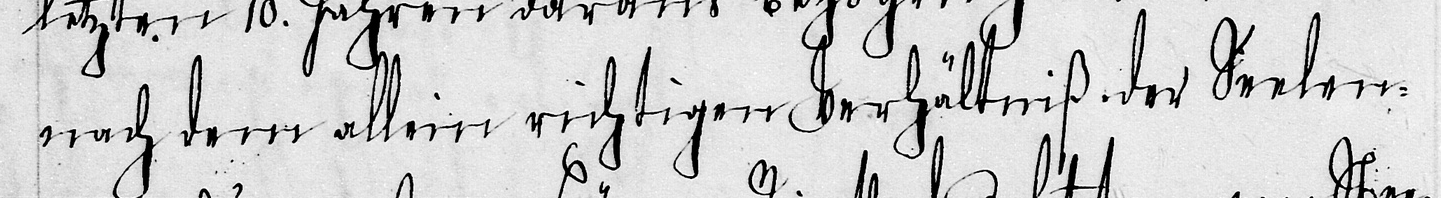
nach dem allein richtigen Verhältniß der Seelen¬
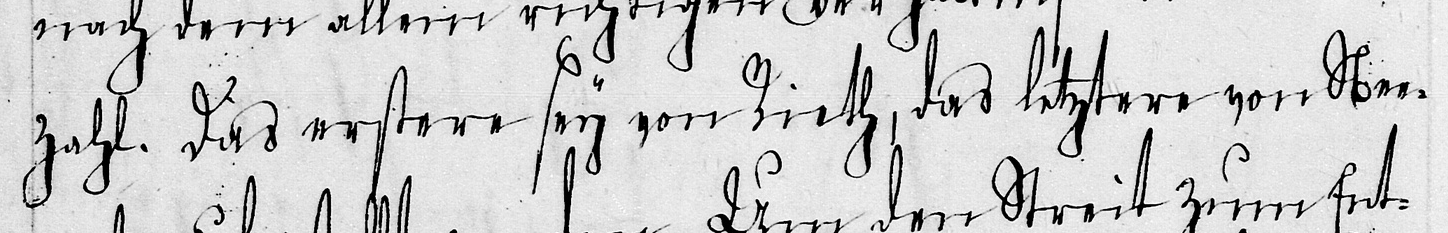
zahl. Das erstere sey von Rieth, das letztere von Nee¬
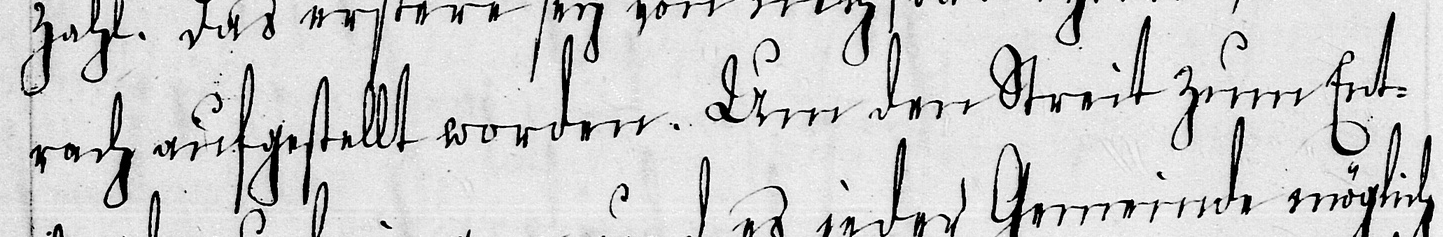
rach aufgestellt worden. Um den Streit zum Ent¬
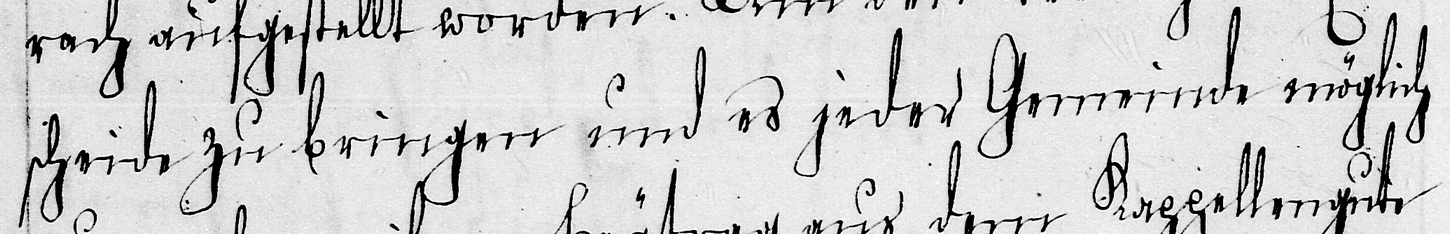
scheide zu bringen und es jeder Gemeinde möglich
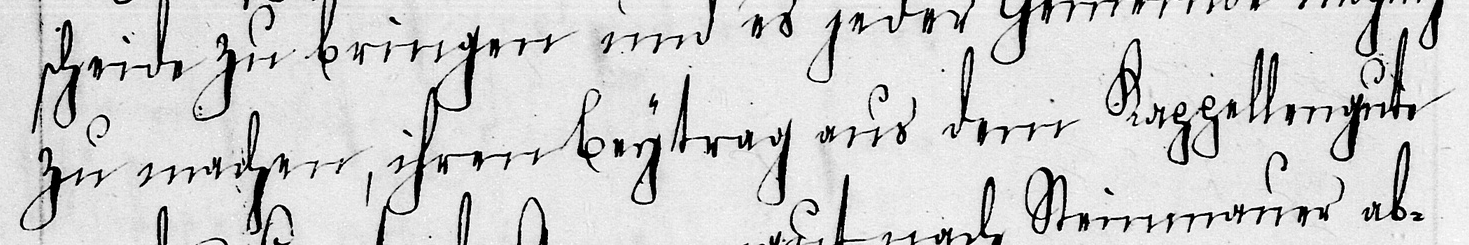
zu machen, ihren Beytrag aus dem Kapellengute
